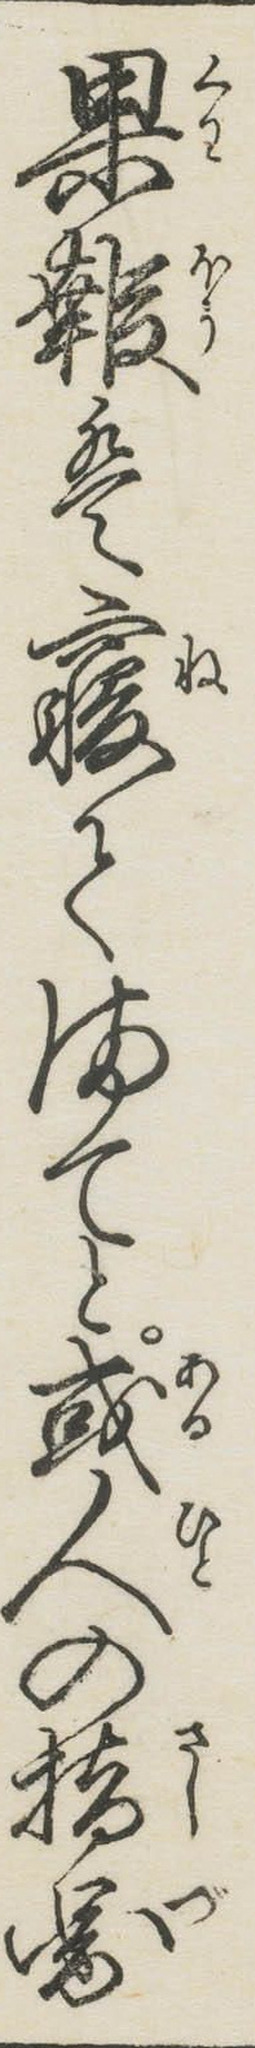果報は寝てまてと。或人の指図
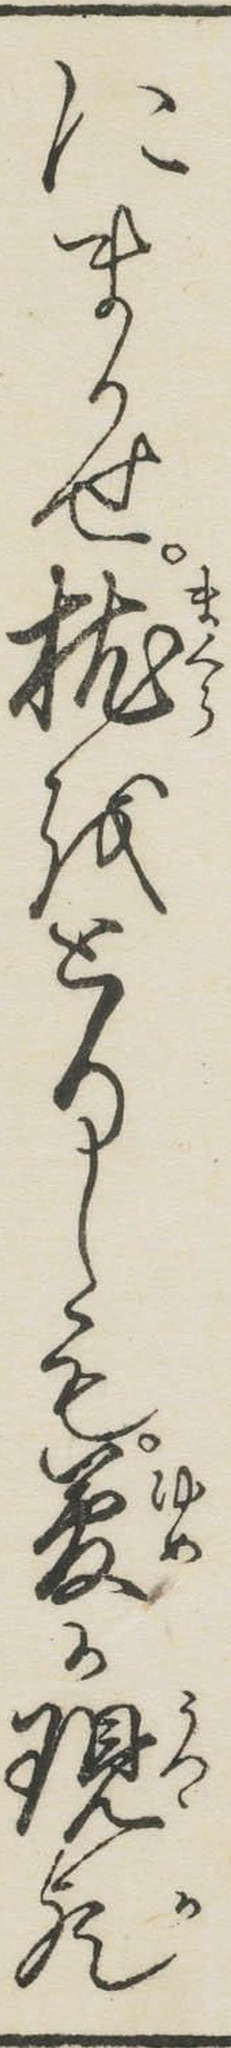にまかせ。枕をとりしも。夢か現欤
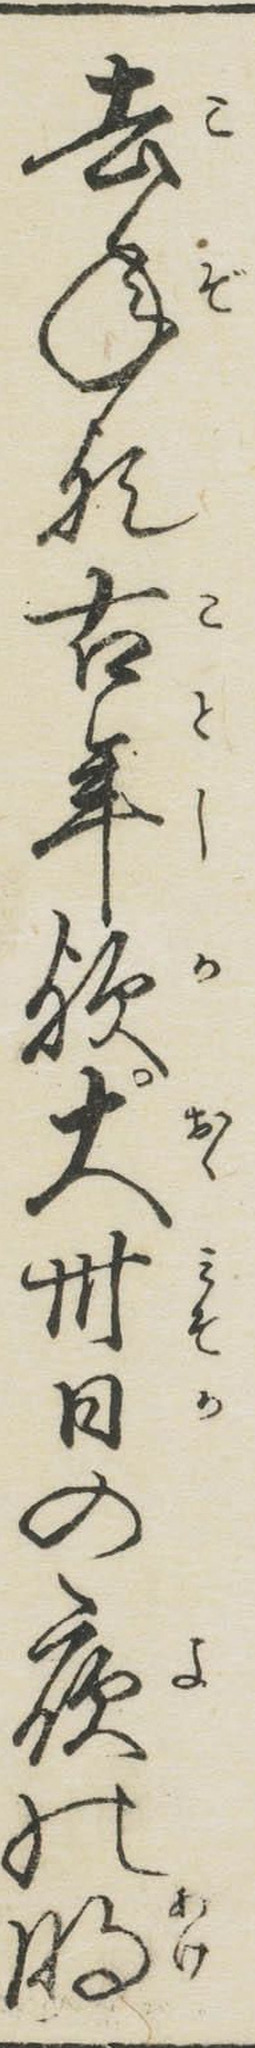去年の古年欤。大卅日の夜の明
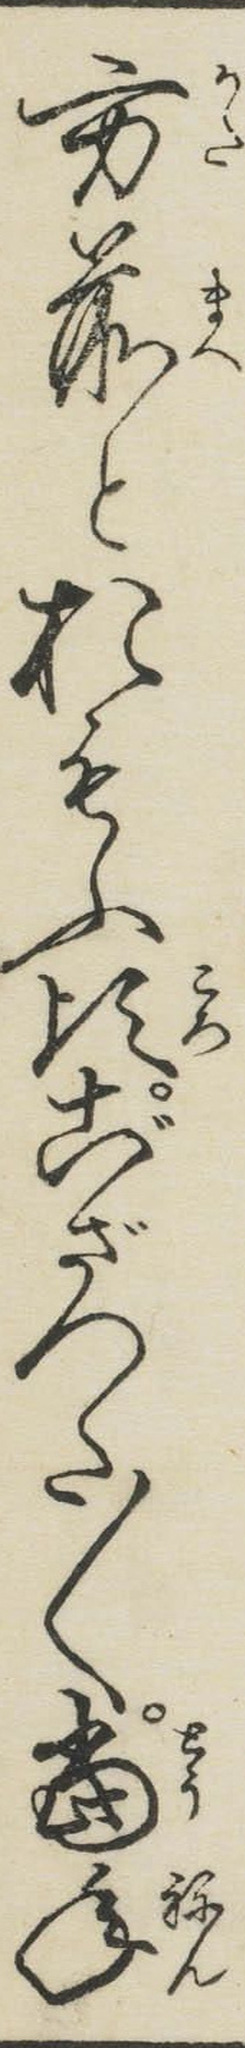方前とおもふ頃ござつた〳〵。当年
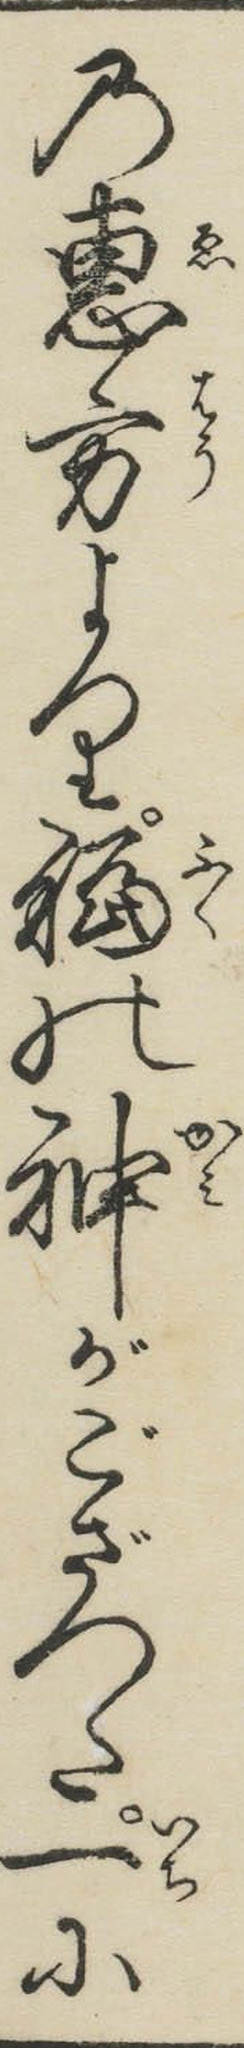の恵方より。福の神がござつた。一に

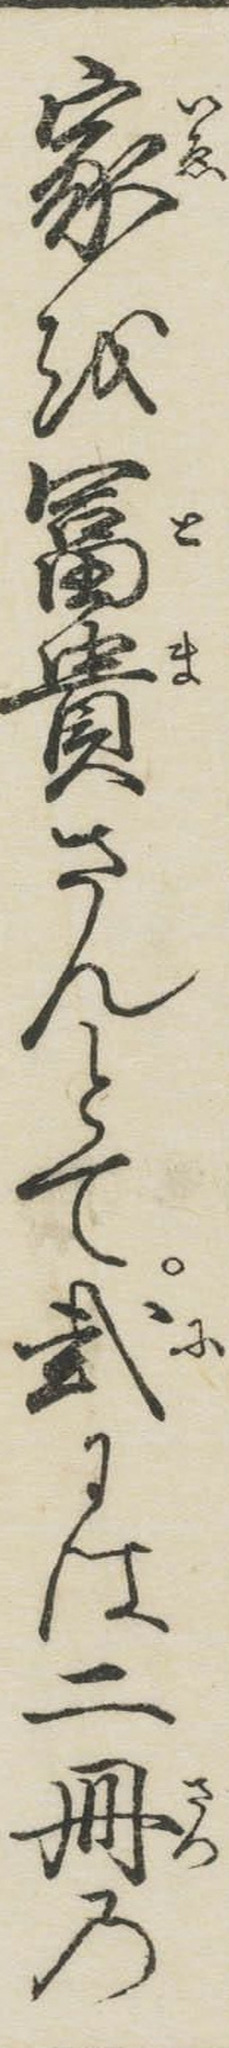家を冨貴さんとて。貮には二冊の
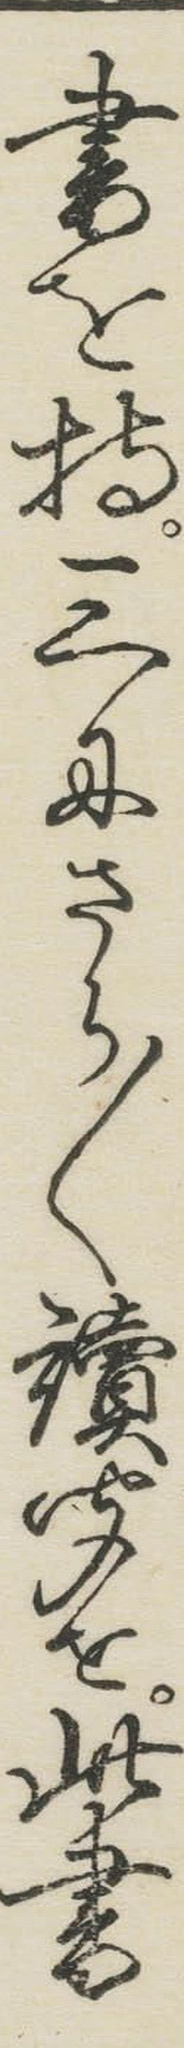書を持。三にさら〳〵読聞せ。此書
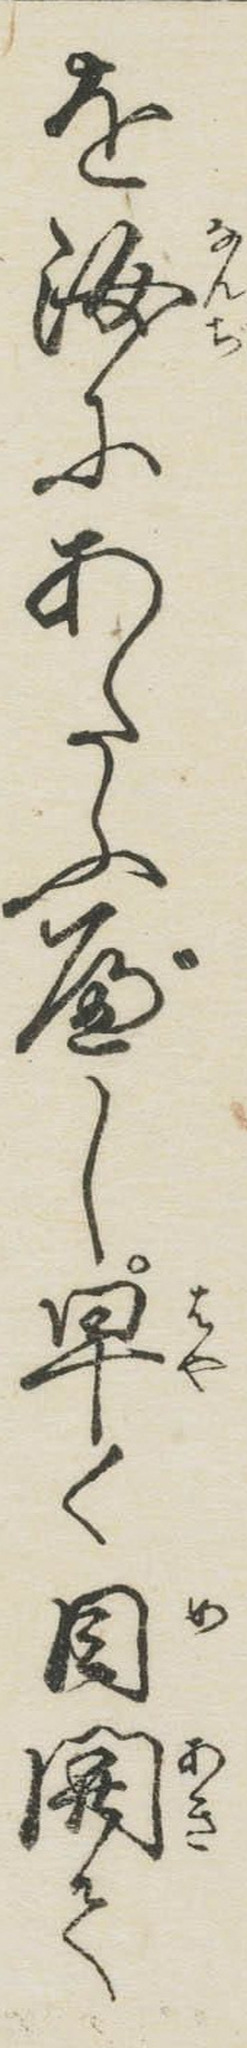を汝にあたふべし。早く目開て
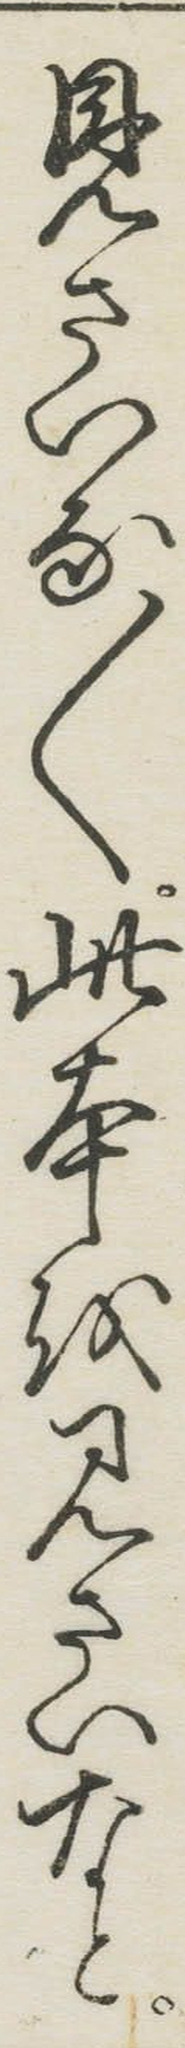見さいな〳〵。此本を見さいなと。
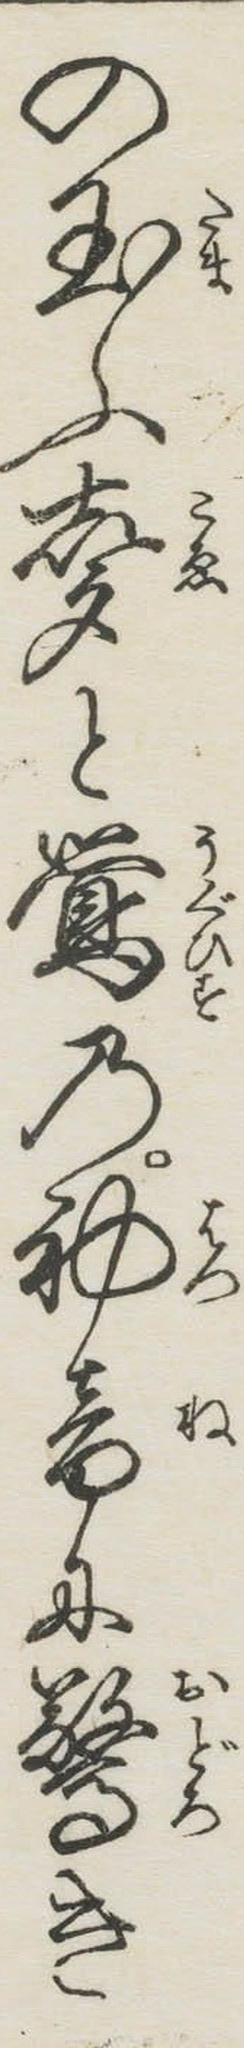の玉ふ声と鶯の。初音に驚き
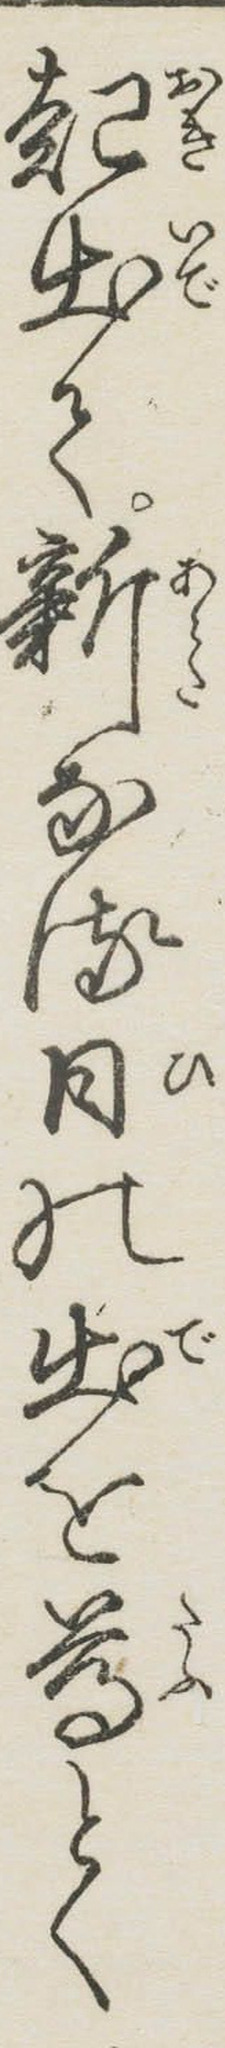起出て。新なる日の出を尊とく
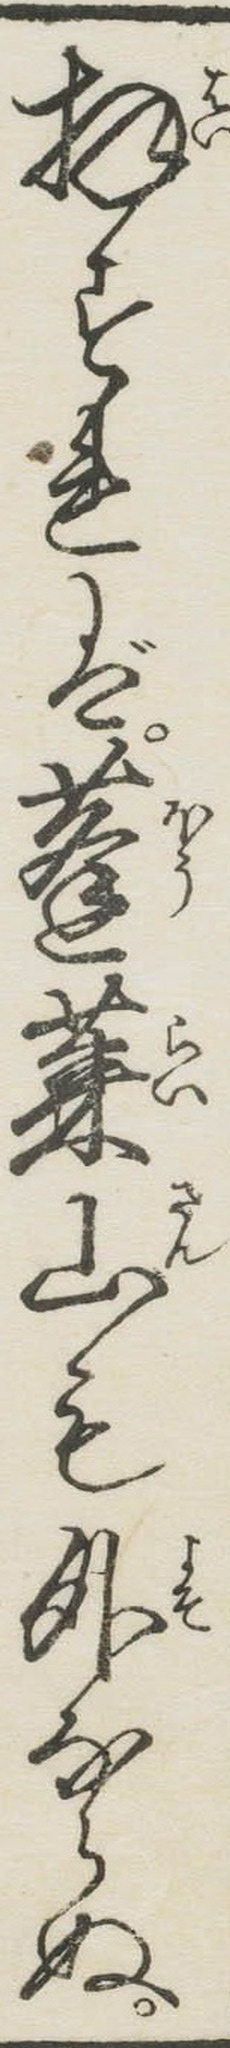拝すれば。蓬莱山も外ならぬ。
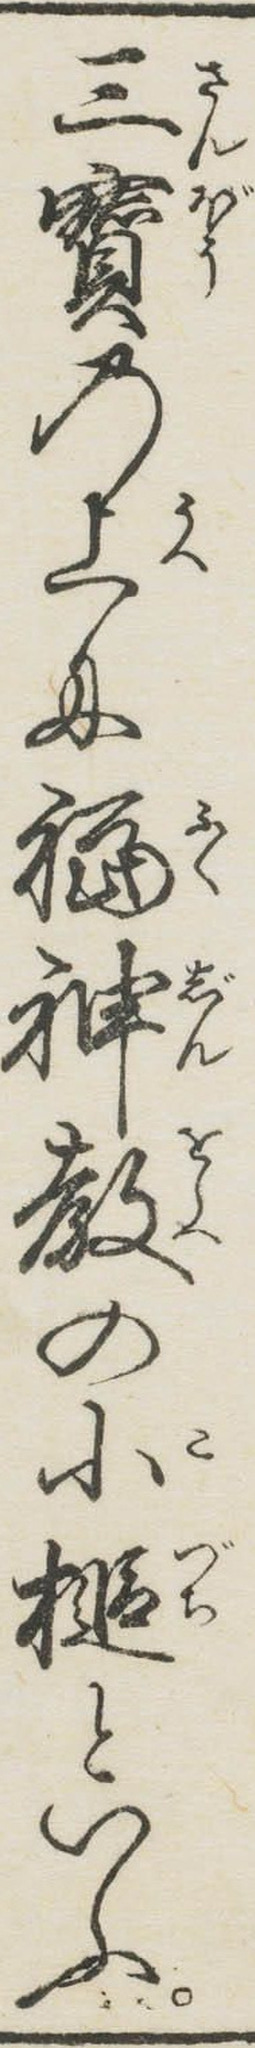三宝の上に福神教の小槌といふ。
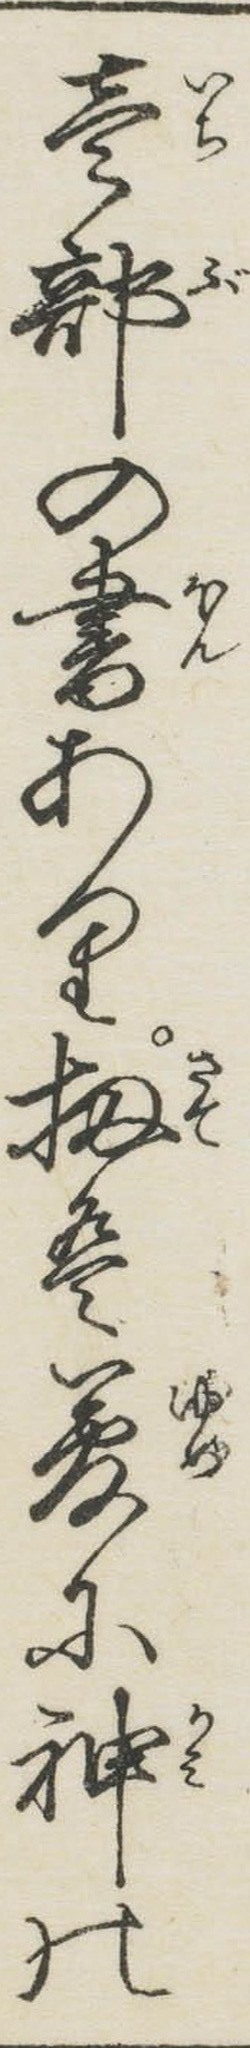壱部の書あり。扨は夢に神の
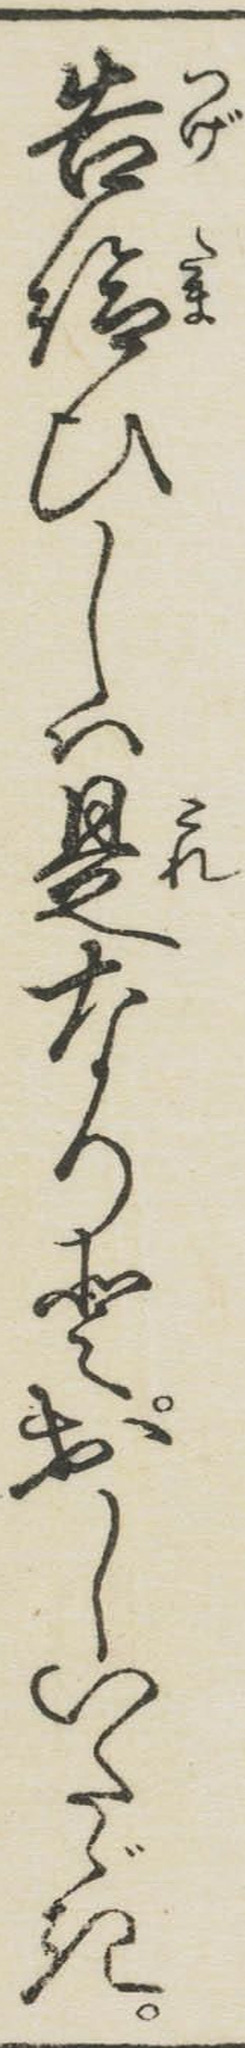告給ひしは是なりと。おしいたゞき。
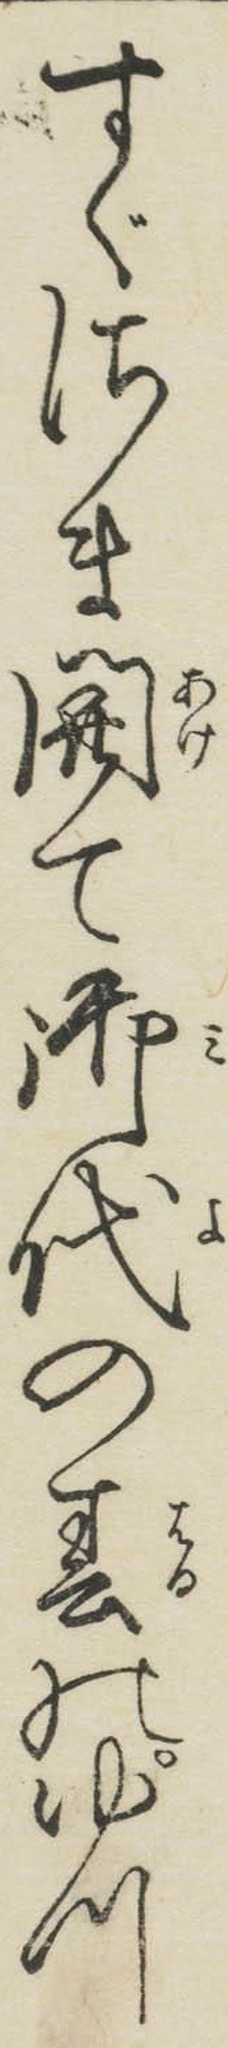すぐさま開て御代の春の。ゆつ
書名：福神おしへの小槌 2巻 上
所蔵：東京学芸大学教育コンテンツアーカイブ
